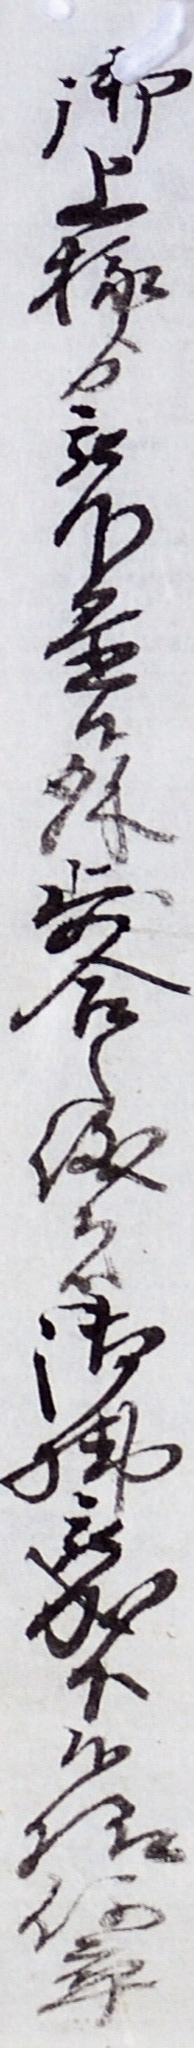御上様ゟ被下置候升歩合之儀ニ而御払被成下候様何卒
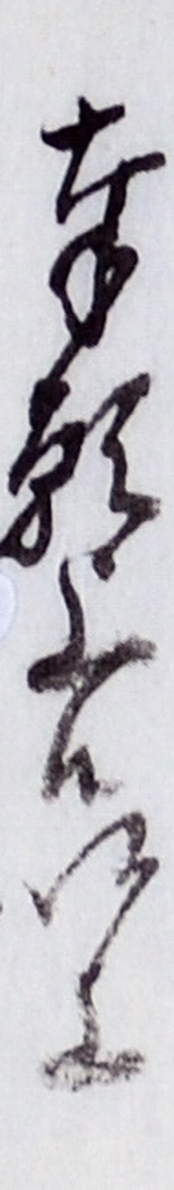奉願上候以上
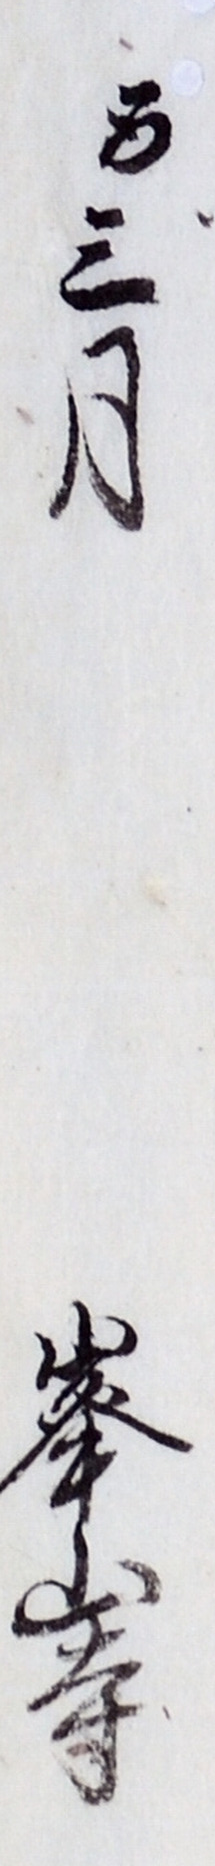酉三月峯山寺
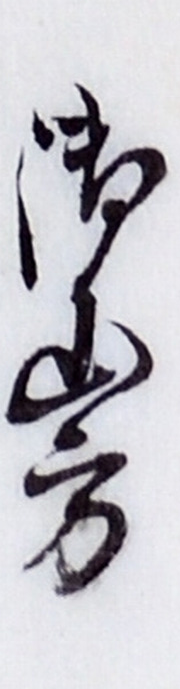御山方
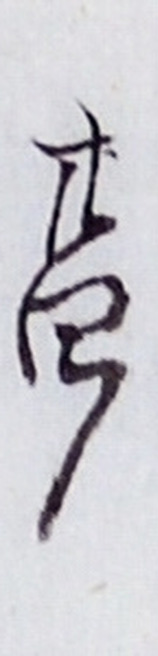廿四日
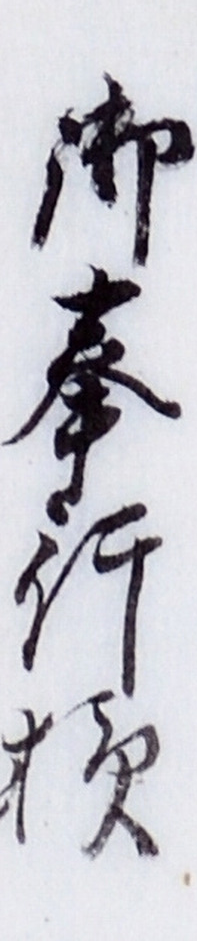御奉行様
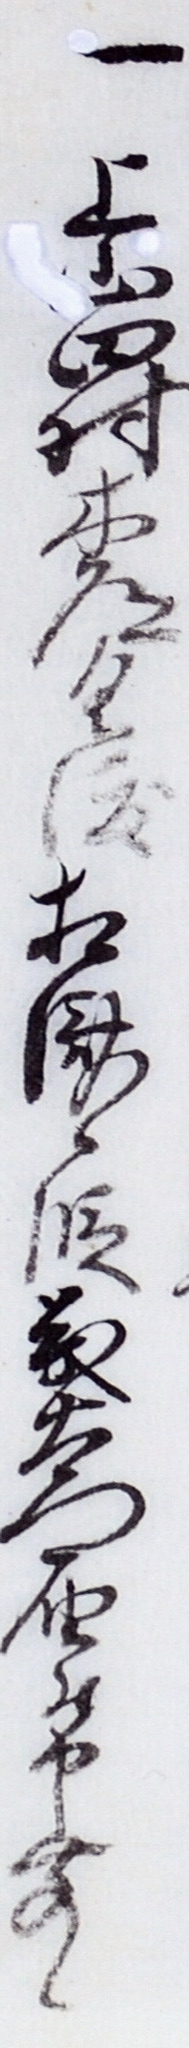一上山田村木道具渡相済候段義右衛門届被申聞候
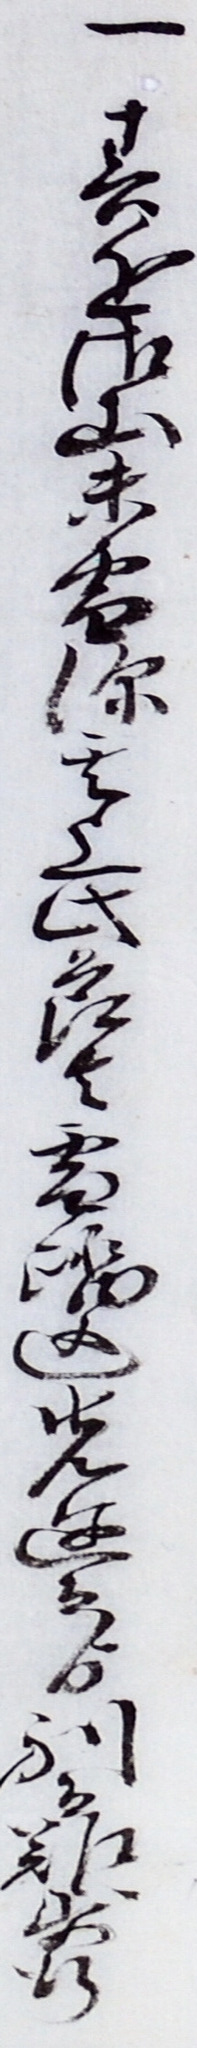一春近御山未雪深其上此節は雹踏込先達而ゟ別而難歩行
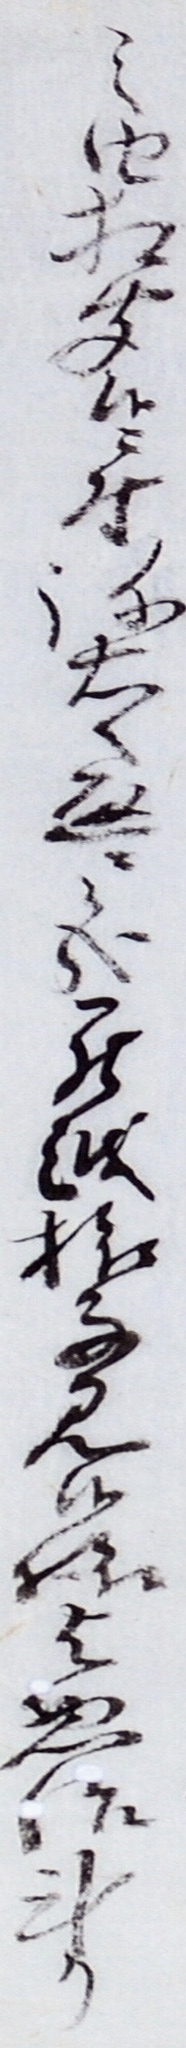之由相聞候ニ付弥右之通ニ候哉罷越様子見候様与惣治計り
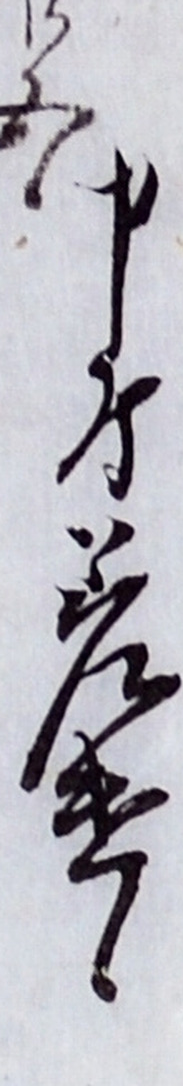申付差遣候
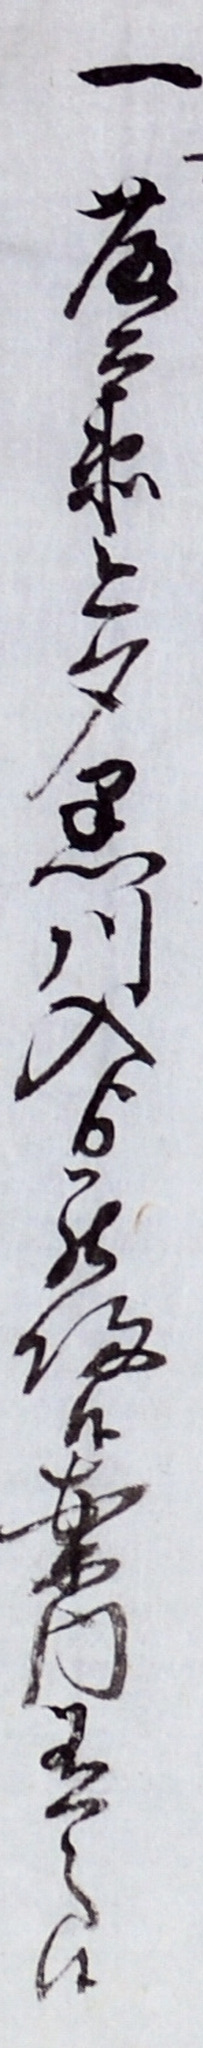一藤兵衛と夕黒川入ゟ罷帰候案内有之候
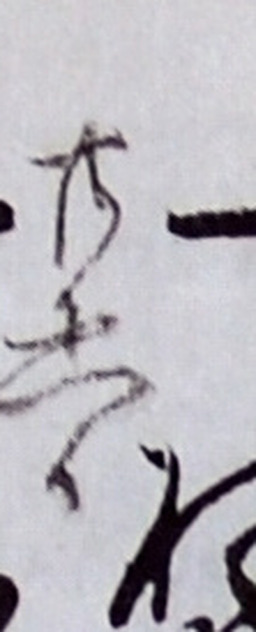廿六日
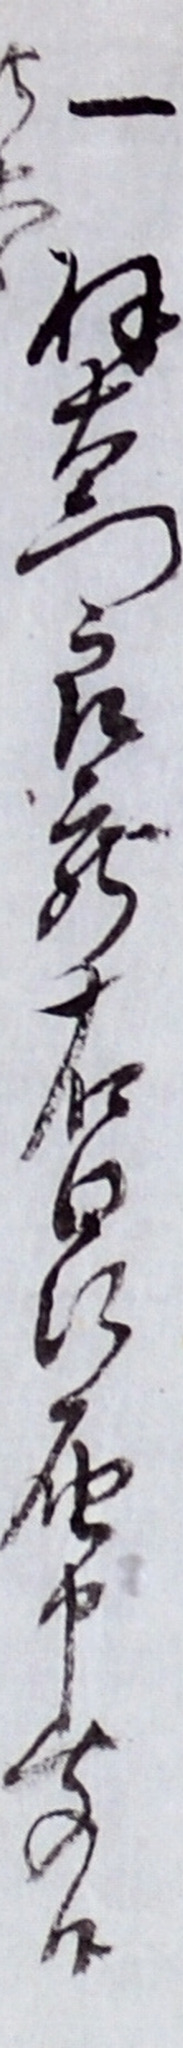一羽右衛門良蔵右同断届申聞候
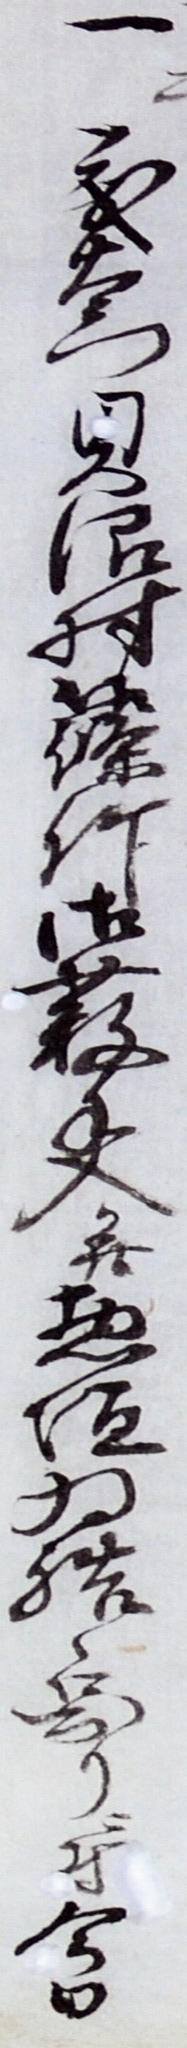一義右衛門貝沼村篠竹御藪手入幷惣垣為結候図りに付今日
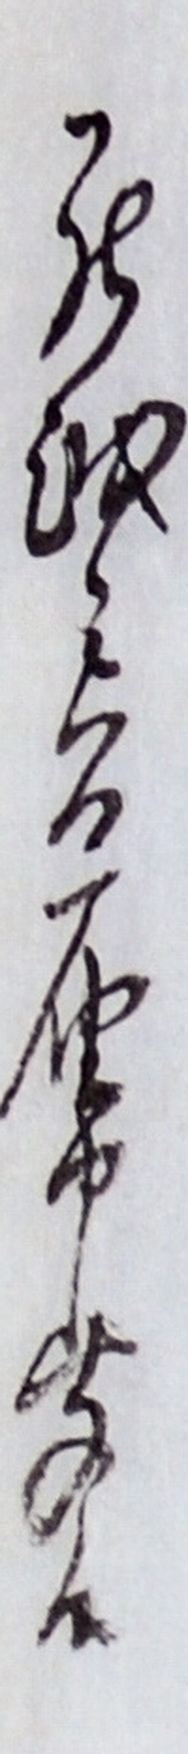罷越候旨届申聞候

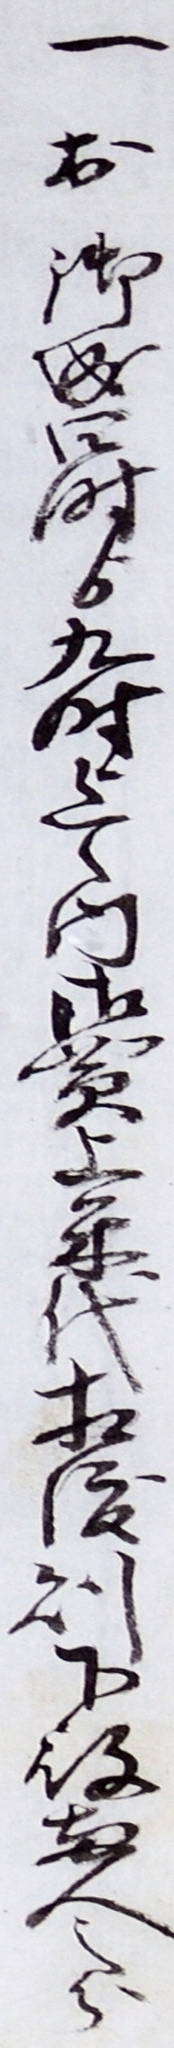一於御城四時ゟ九時迄之内御買上米代相渡則下役両人之分
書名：御山奉行御用控
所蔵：伊那市立高遠町図書館・合同会社AMANE
